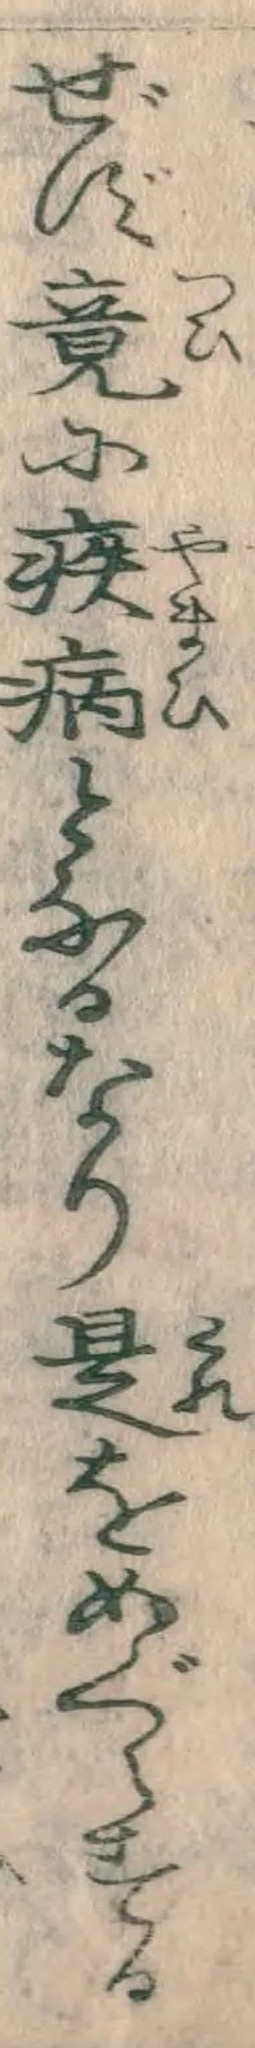ぜず竟に疾病となるなり是をめぐらする
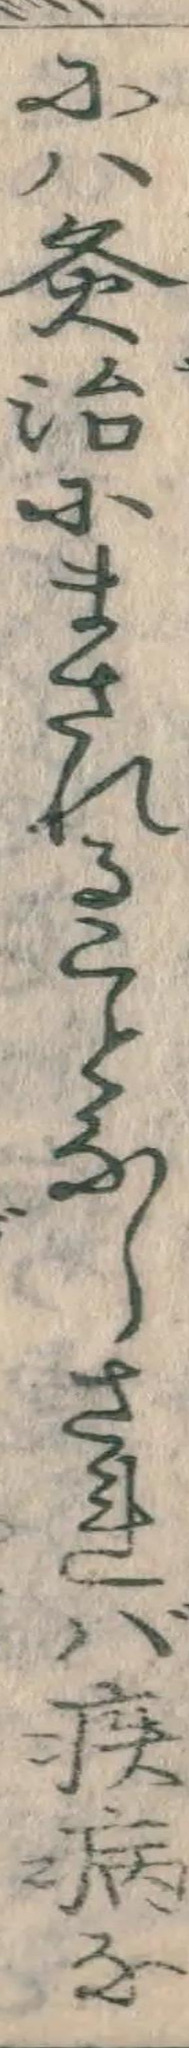には灸治にまされることなしされば疾病な
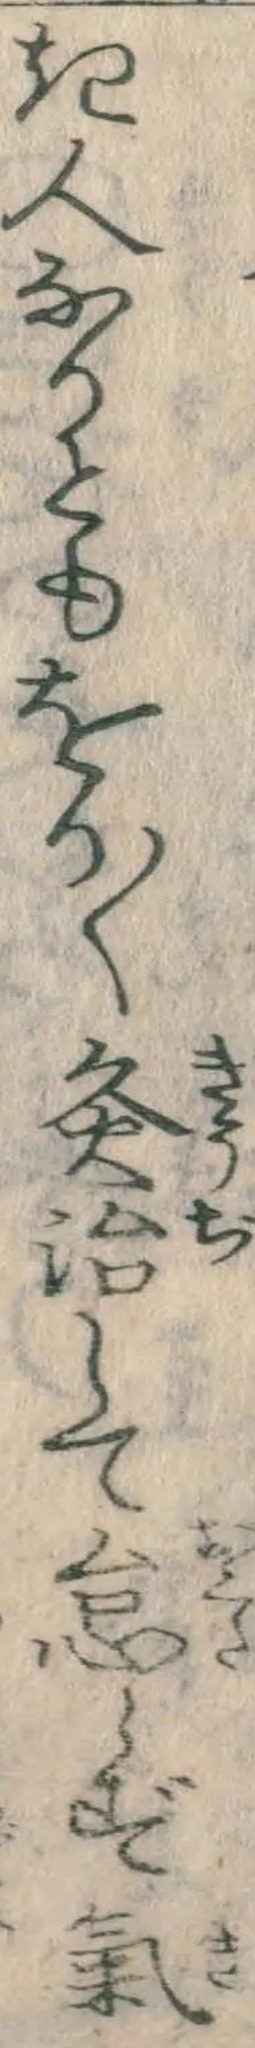き人なりともをり〳〵灸治して怠らず気
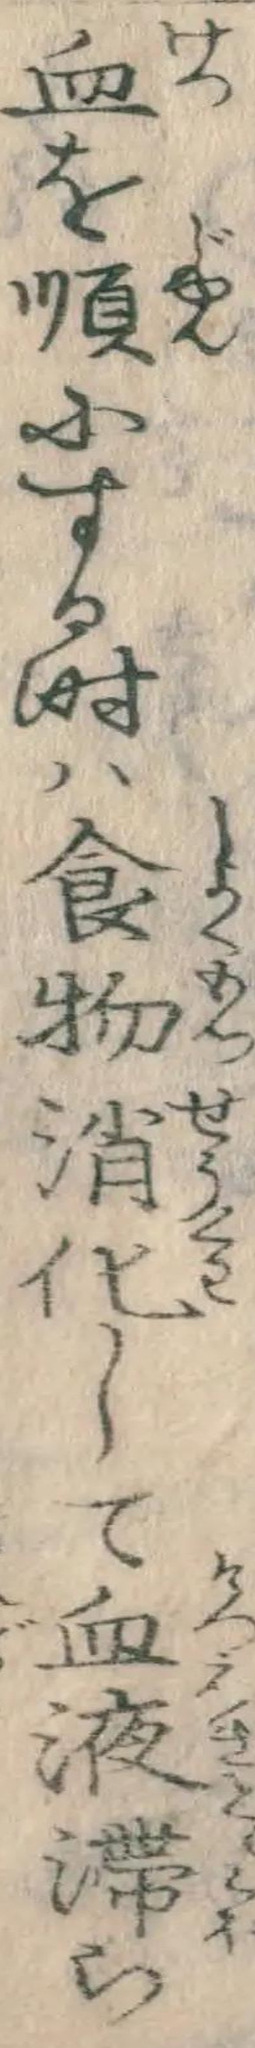血を順にする時は食物消化して血液滞ら
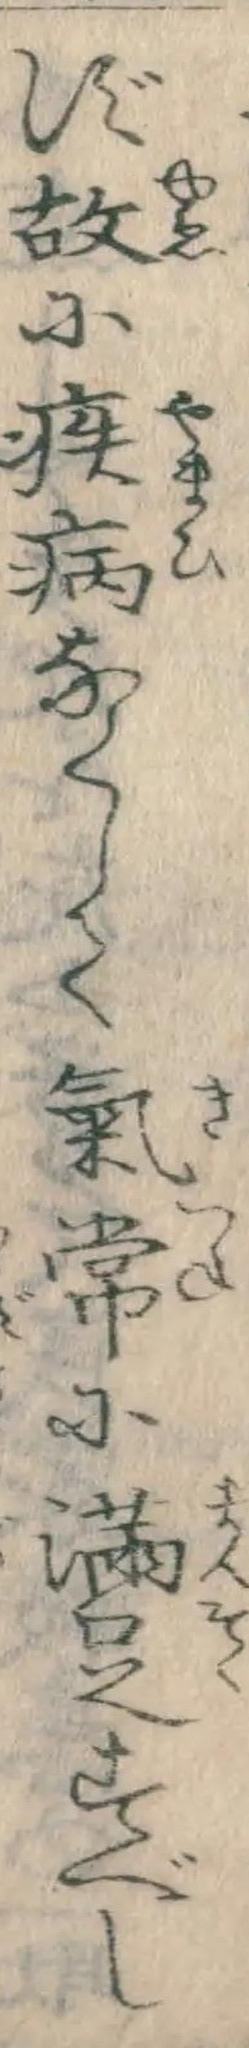ず故に疾病なくして気常に満足すべし
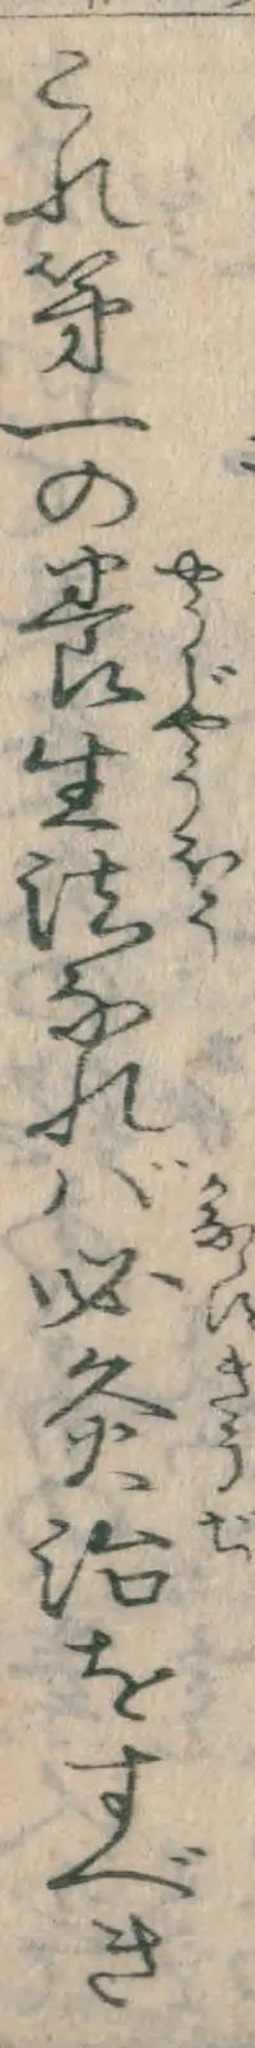これ第一の養生法なれば必灸治をすべき

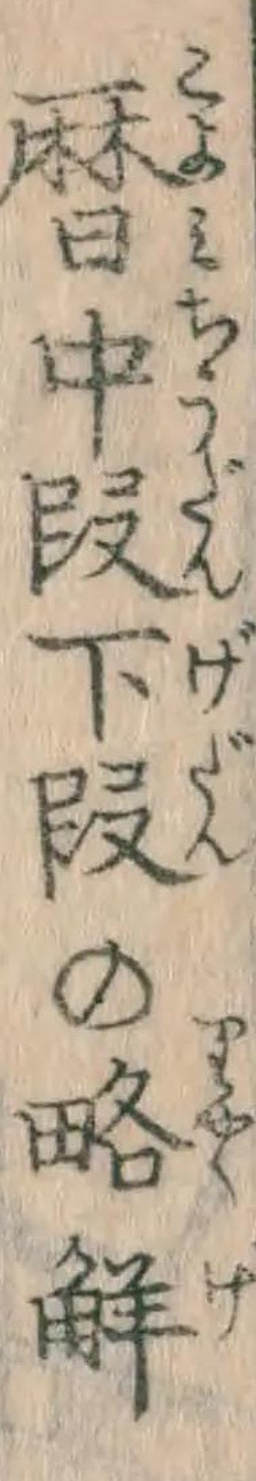暦中段下段の略解
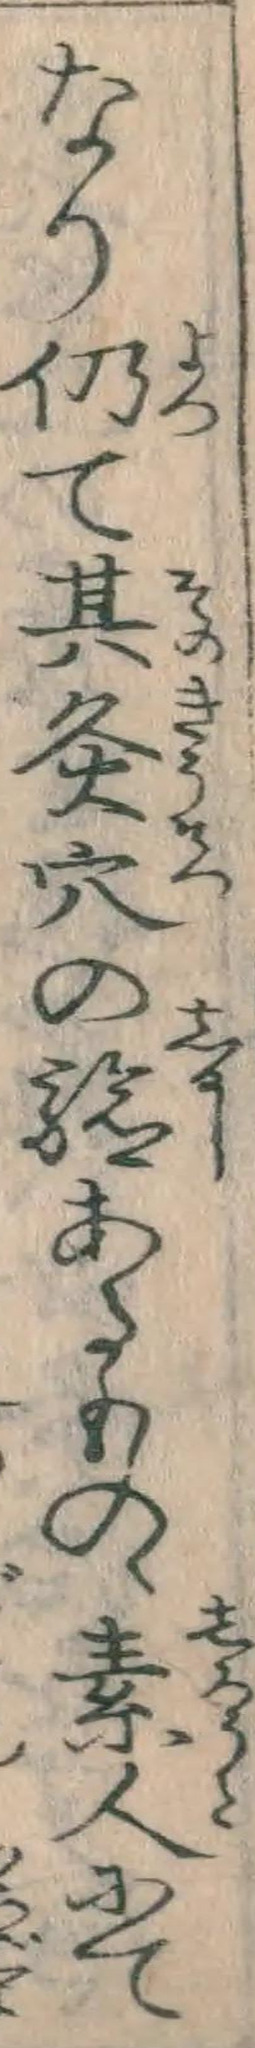なり仍て其灸穴の験あるものゝ素人にて
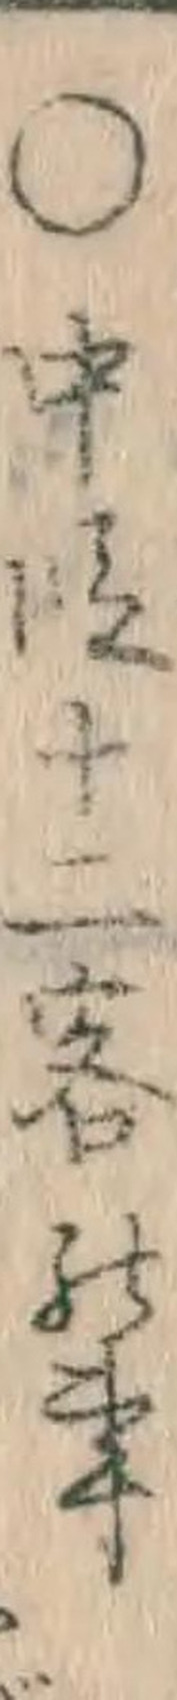○中段十二客の事
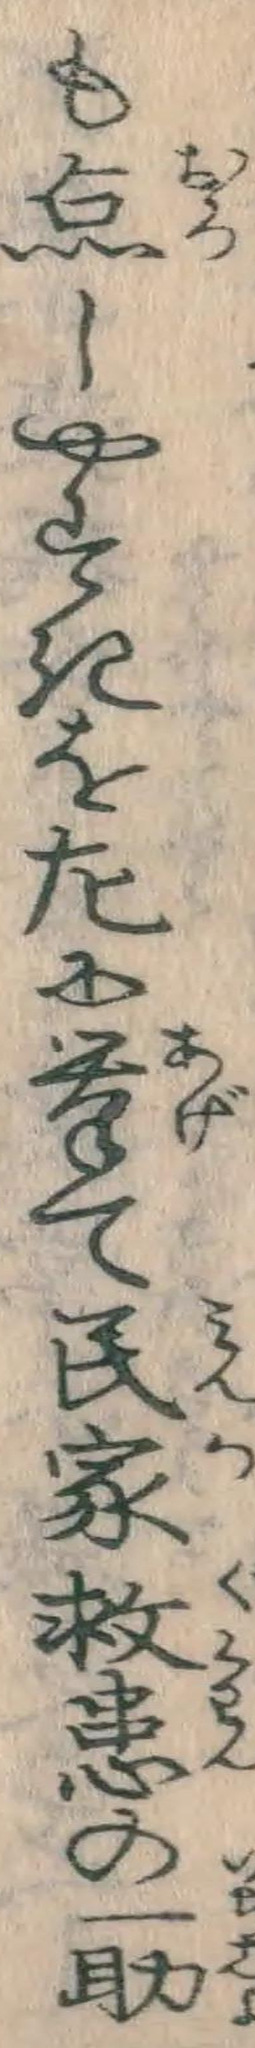も点しやすきを左に挙て民家救患の一助
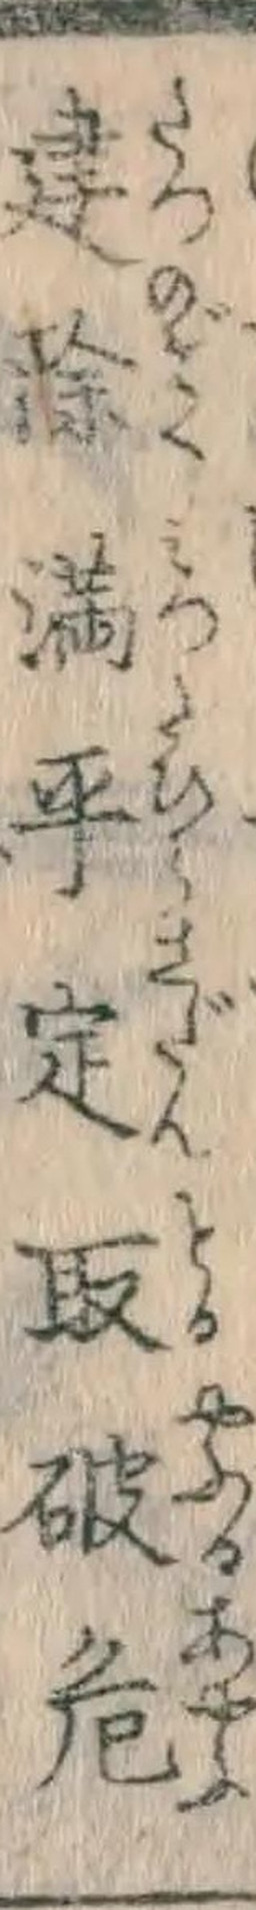建除満平定取破危
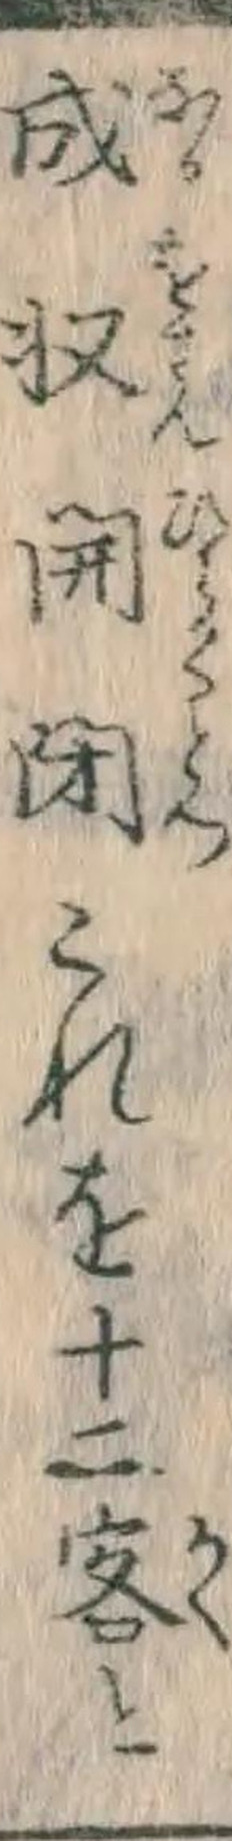成収開閉これを十二客と
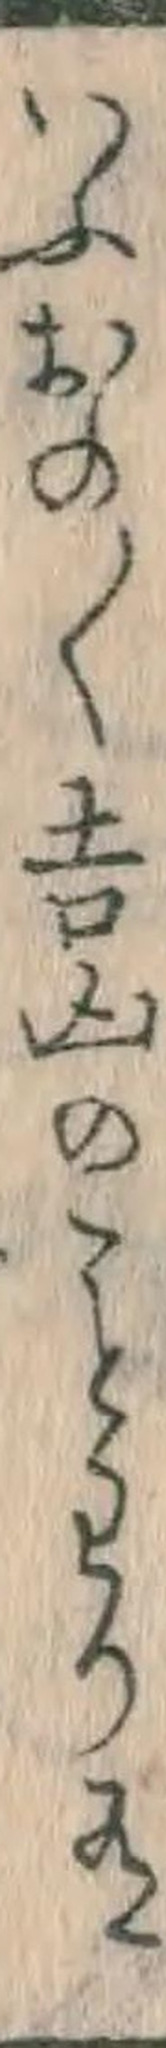いふおの〳〵吉凶のことわり有
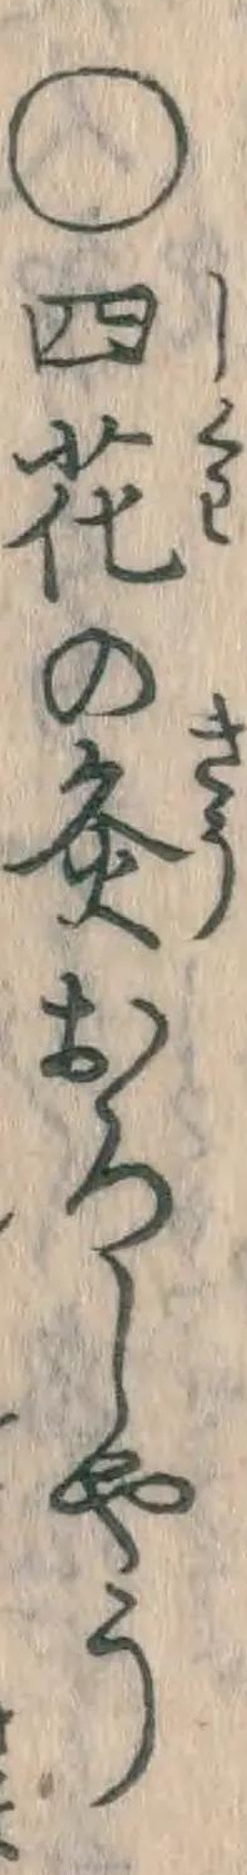○四花の灸おろしやう
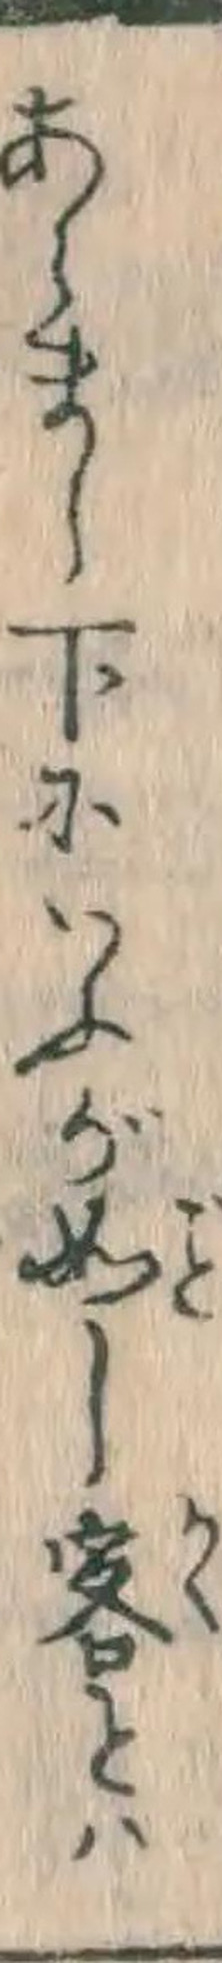あらまし下にいふが如し客とは
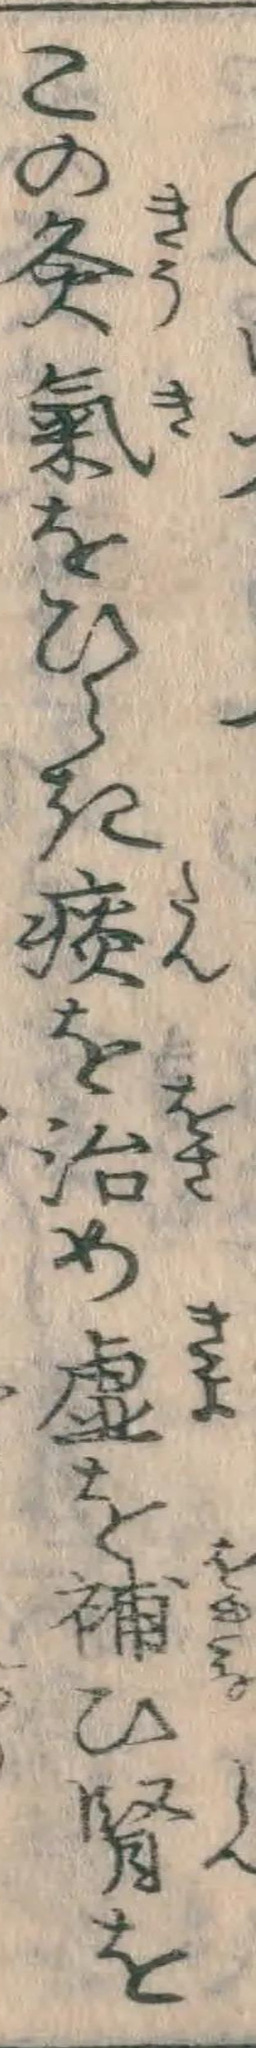この灸気をひらき痰を治め虚を補ひ腎を
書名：広益秘事大全 3巻. [4]
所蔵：国立国会図書館 National Diet Library, JAPAN
